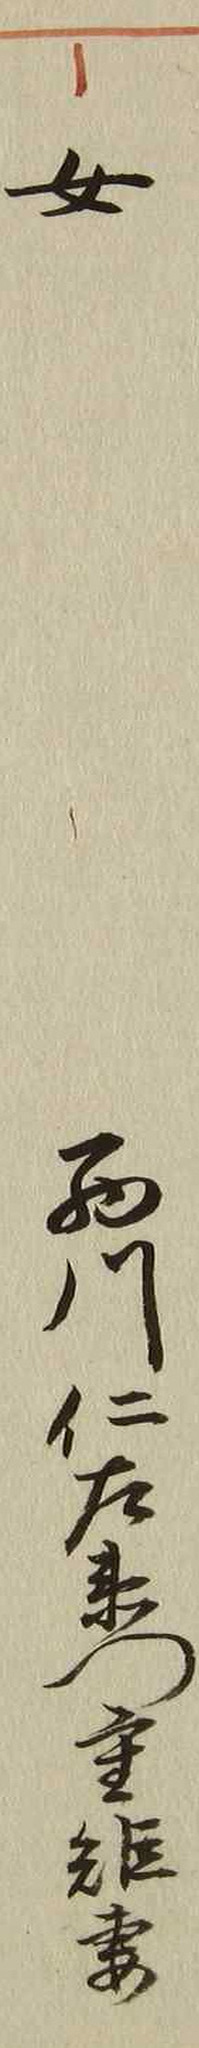女西川仁左衛門重矩妻
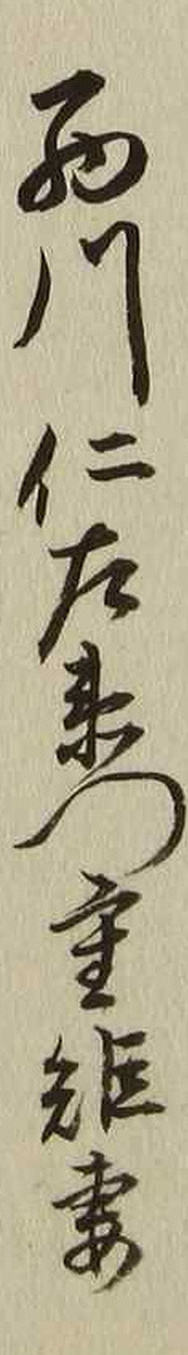女西川仁左衛門重矩妻
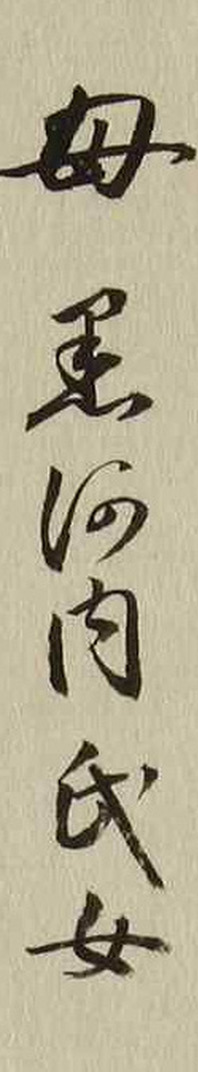母黒河内氏女
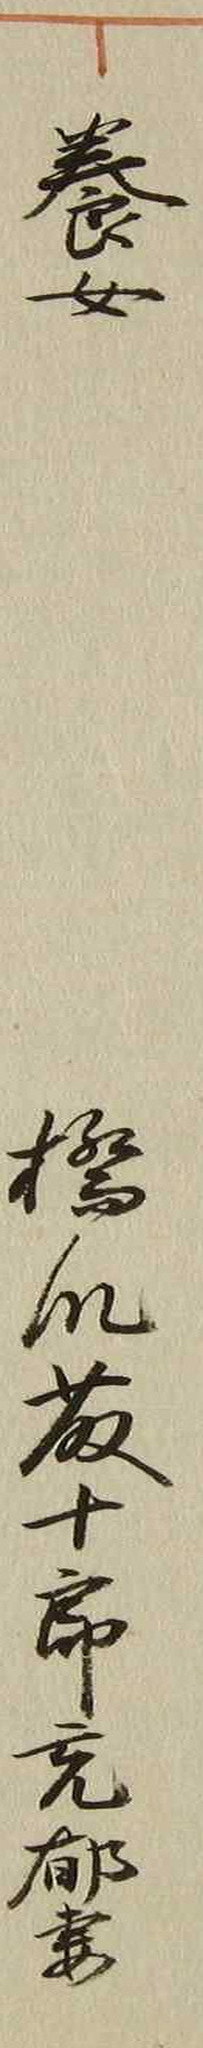養女橋爪藤十郎充郁妻
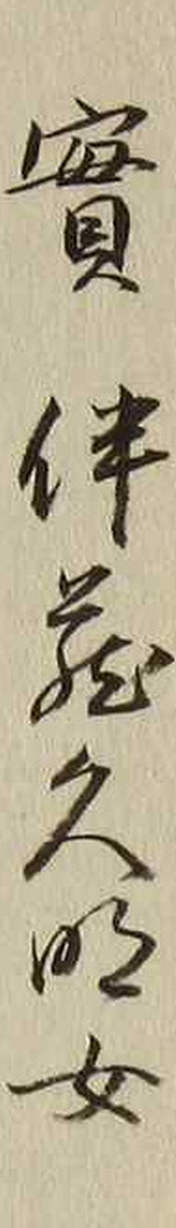実伴蔵久明女
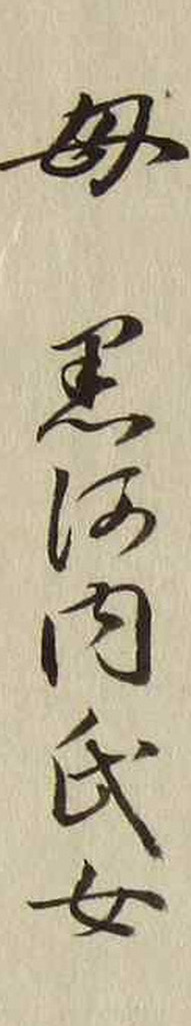母黒河内氏女
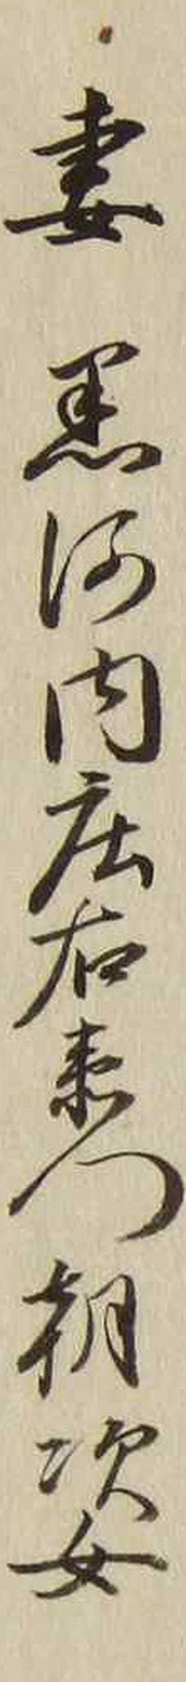妻黒河内庄右衛門朝次女

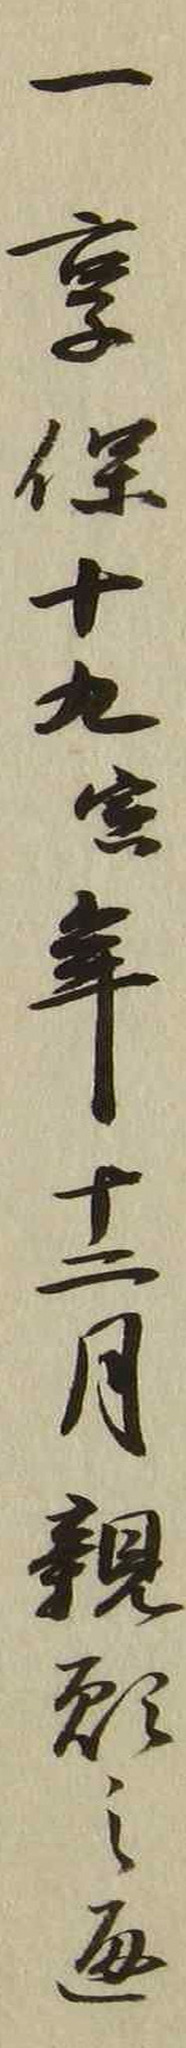一享保十九寅年十二月親願之通
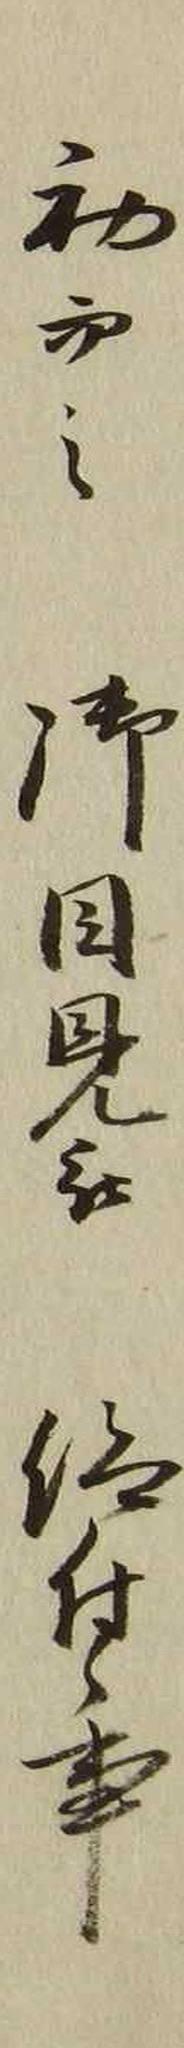初而之御目見被仰付候事
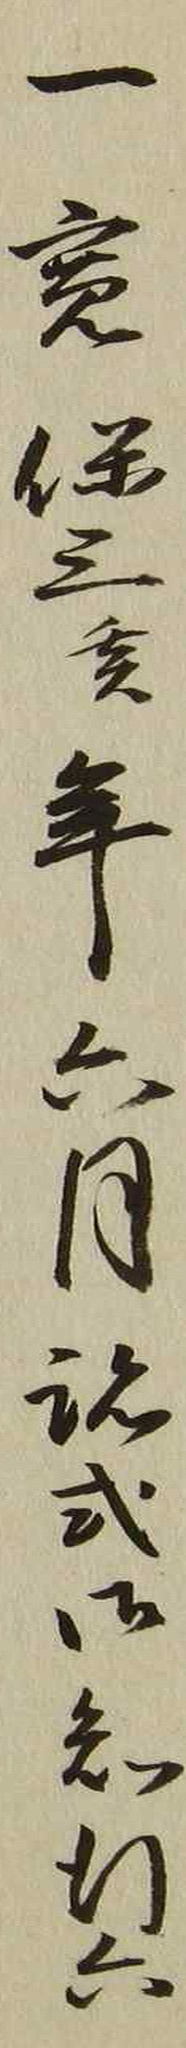一寛保三亥年六月跡式御知行六
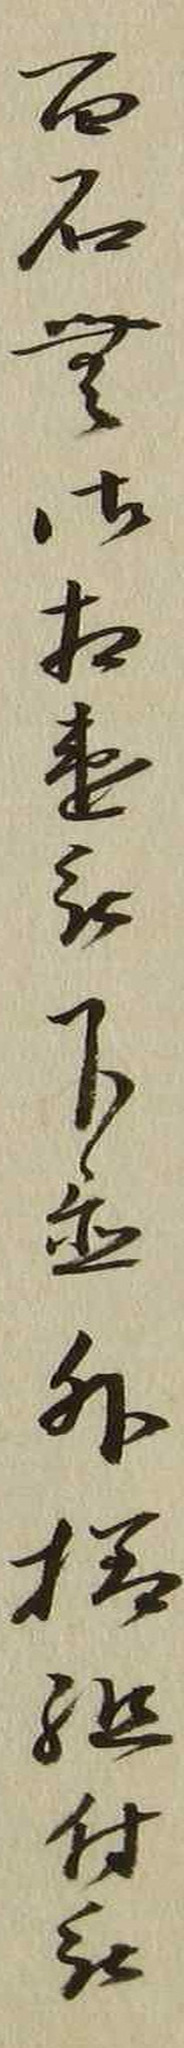百石無御相違被下置外様組付被
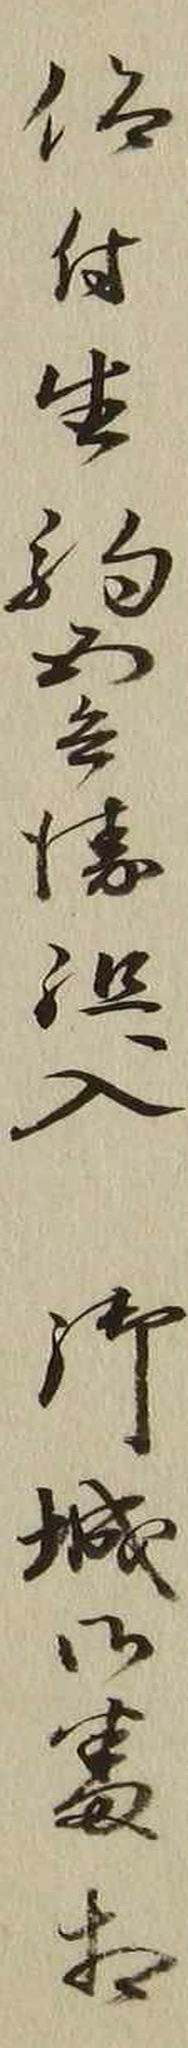仰付生駒五兵衛組へ入御城御番相
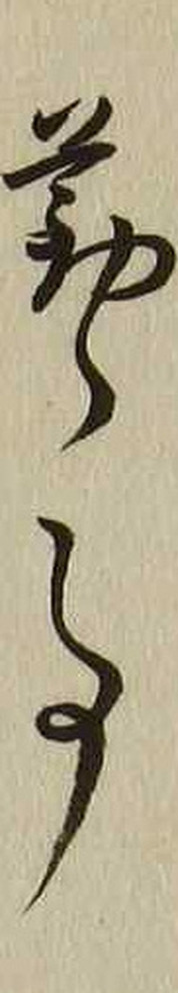勤候事
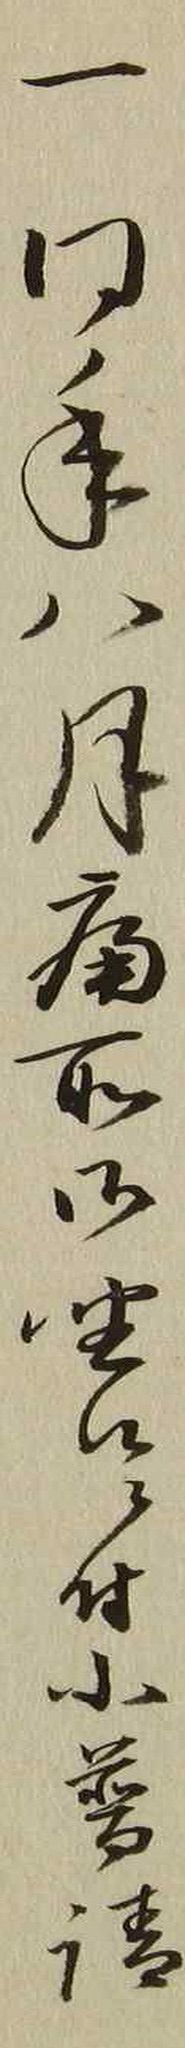一同年八月痛所御坐候ニ付小普請
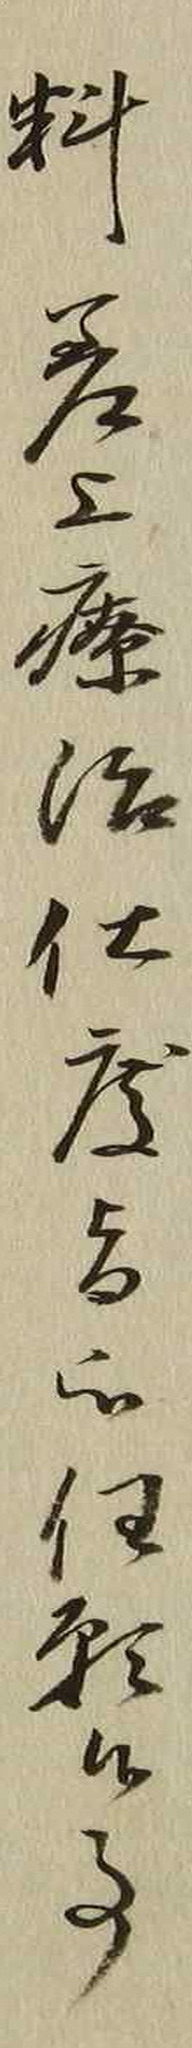料差上療治仕度旨被任願候事
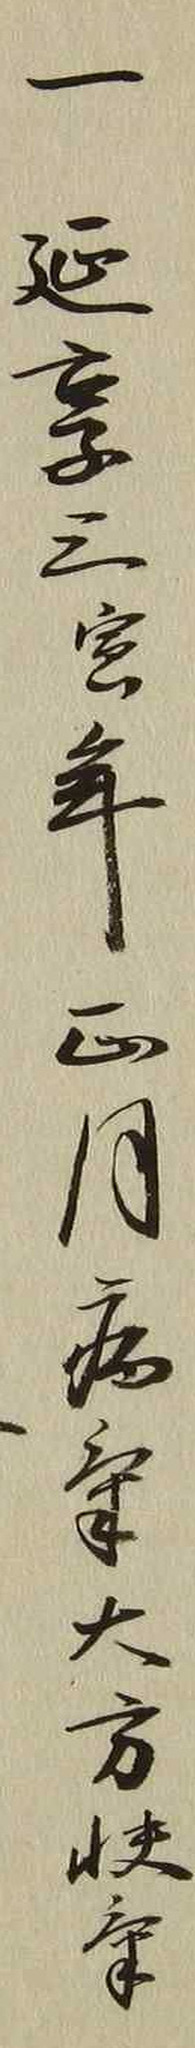一延享三寅年正月病気大方快気
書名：諸士系譜　巻之69　を之部3
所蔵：会津若松市立会津図書館
